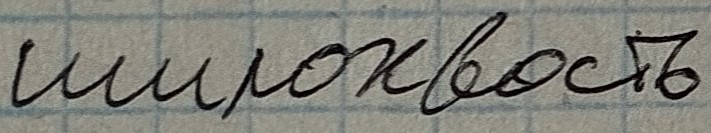шилохвость
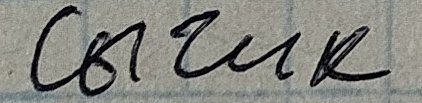сычик
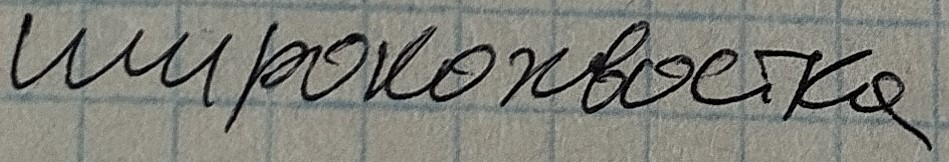широкохвостка
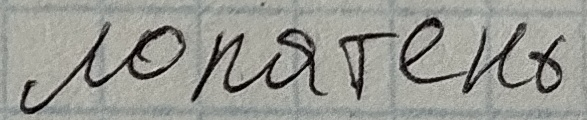лопатень
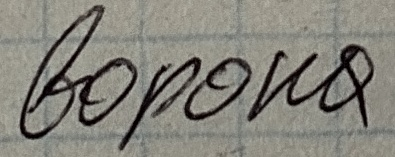ворона
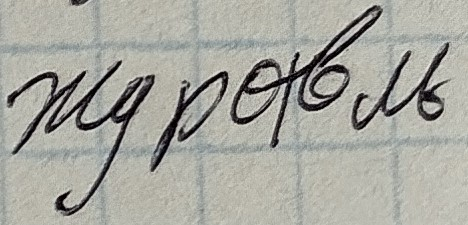журавль
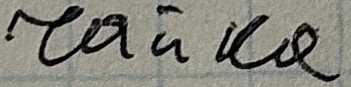чайка
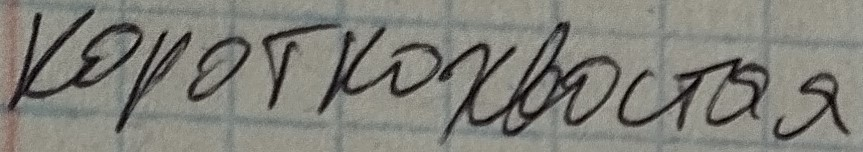короткохвостая
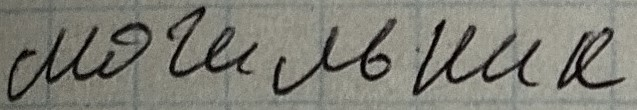могильник
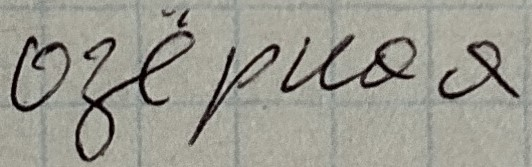озёрная
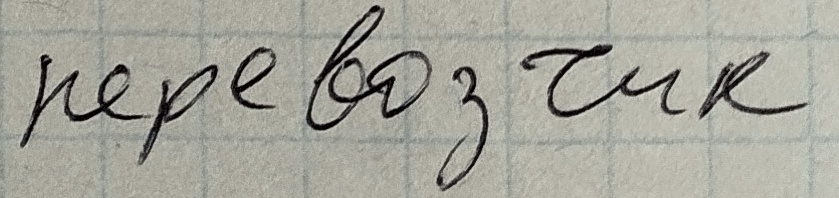перевозчик
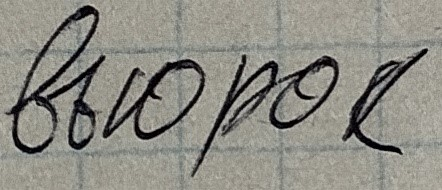вьюрок
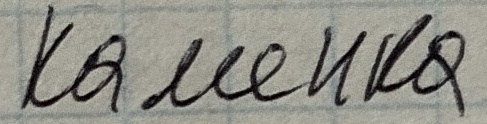каменка
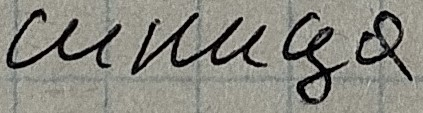синица
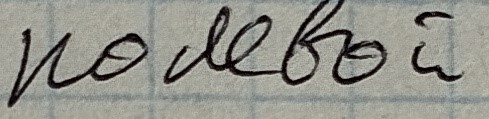полевой
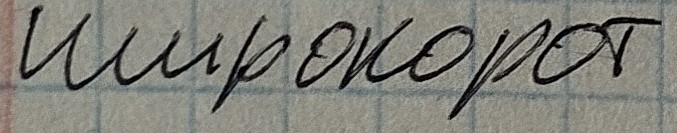широкорот
